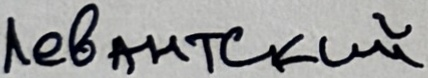левантский
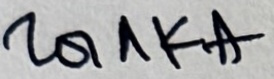галка
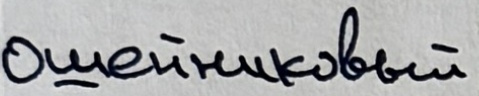ошейниковый
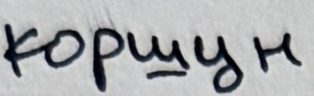коршун
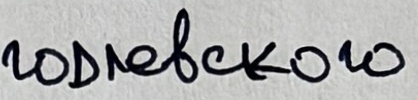годлевского
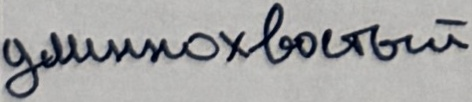длиннохвостый
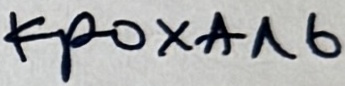крохаль
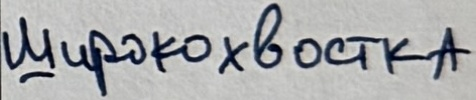широкохвостка
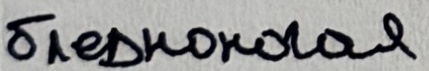бледноногая
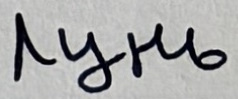лунь
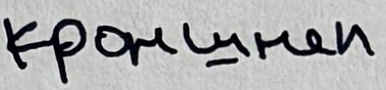кроншнеп
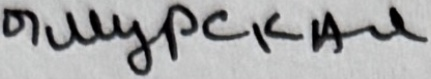амурская
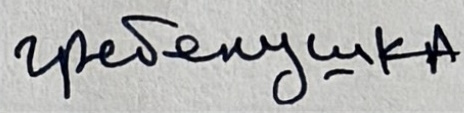гребенушка
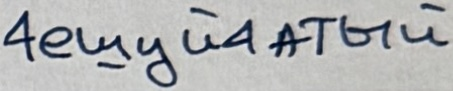чешуйчатый
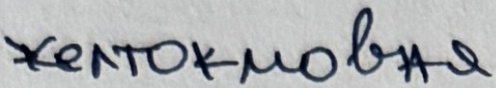желтоклювая
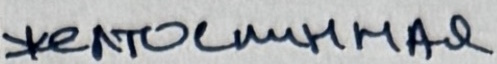желтоспинная
